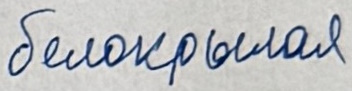белокрылая
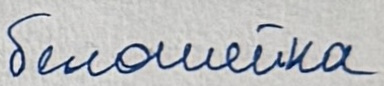белошейка
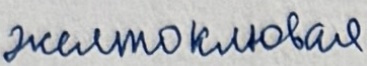желтоклювая
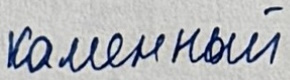каменный
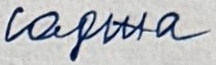саджа
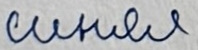синяя
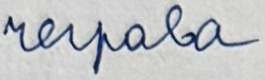чеграва
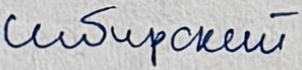сибирский
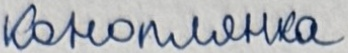коноплянка
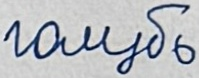голубь
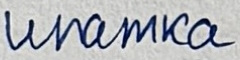ипатка
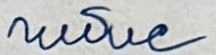чибис
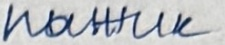пыжик
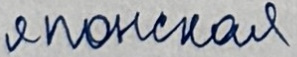японская
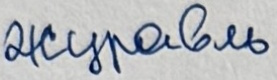журавль
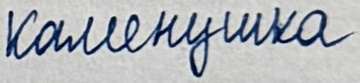каменушка
